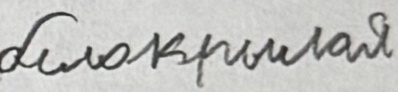белокрылая
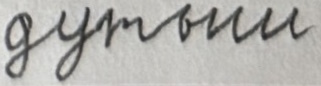дутыш
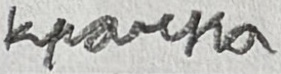крачка
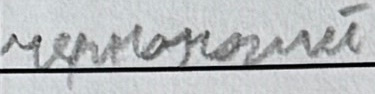черноногий
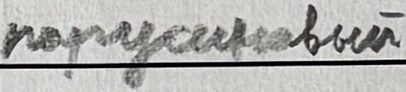парусиновый
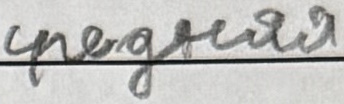средняя
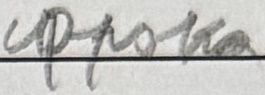сфрока
